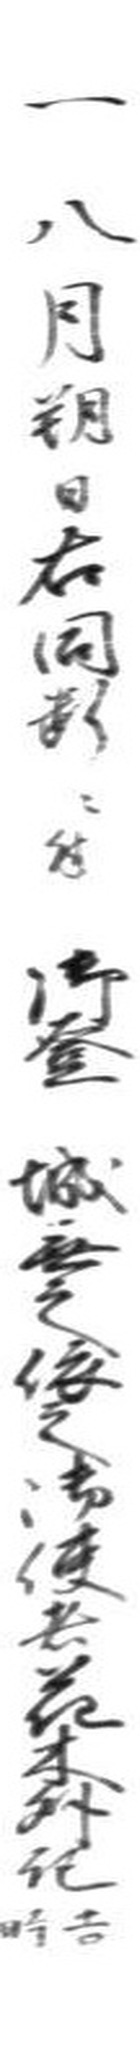一八月朔日右同断ニ付御登城無之依之御使者花木外記吉時
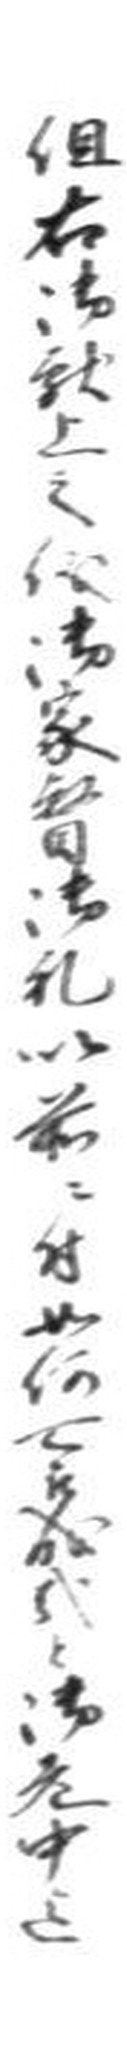但右御献上之儀御家督御礼以前ニ付如何可被成哉と御老中迄

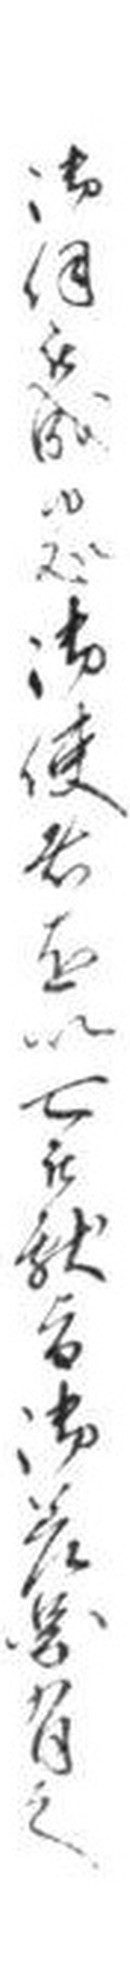御伺被成候処御使者を以可被献旨御差図有之
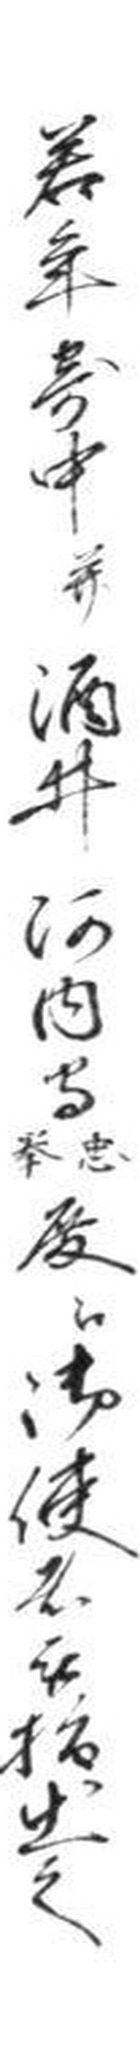若年寄中并酒井河内守忠挙殿江御使者被指出之
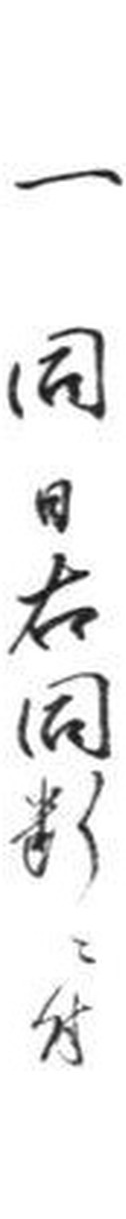一同日右同断ニ付
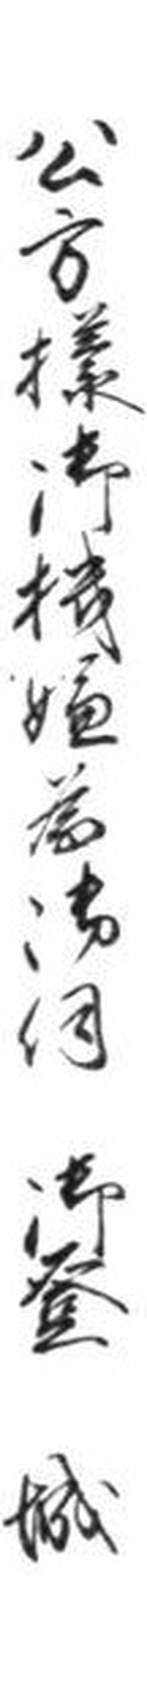公方様御機嫌為御伺御登城
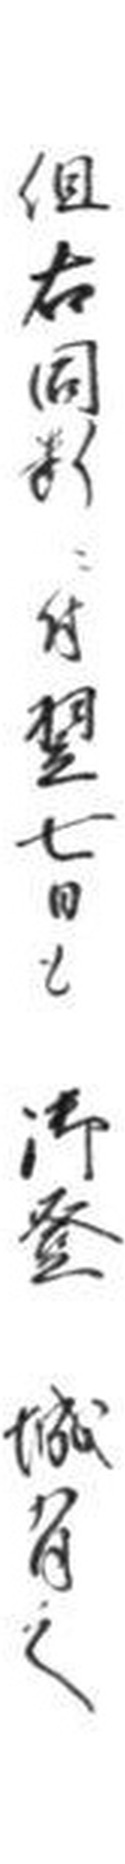但右同断ニ付翌七日も御登城有之
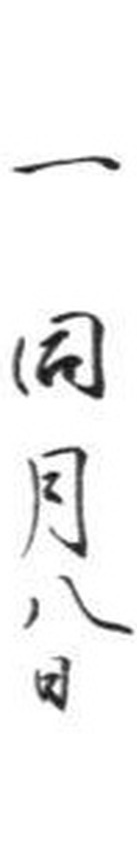一同月八日
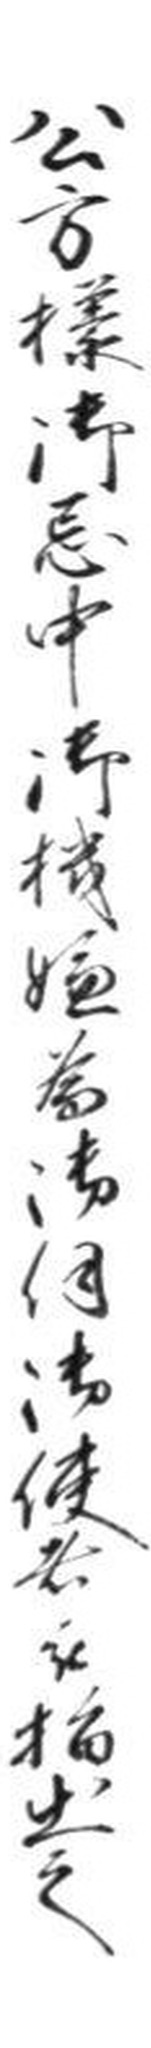公方様御忌中御機嫌為御伺御使者被指出之
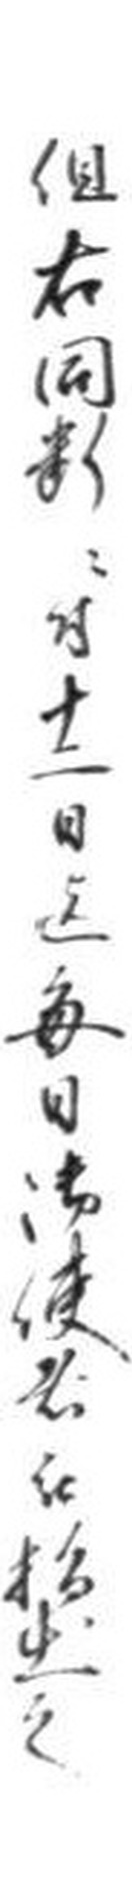但右同断ニ付十二日迄毎日御使者被指出之
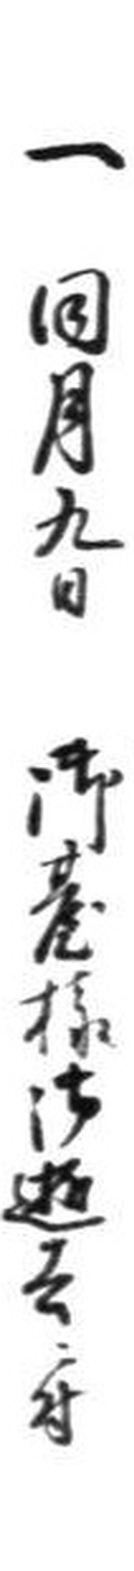一同月九日御台様御逝去ニ付
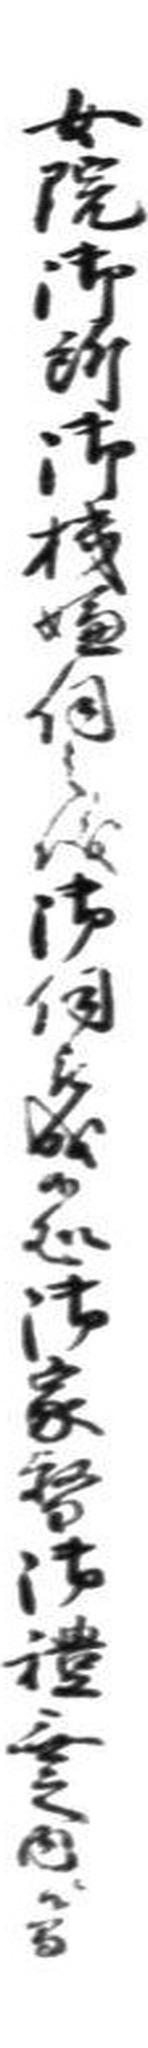女院御所御機嫌伺之儀御伺被成候処御家督御礼無之内ニ候間
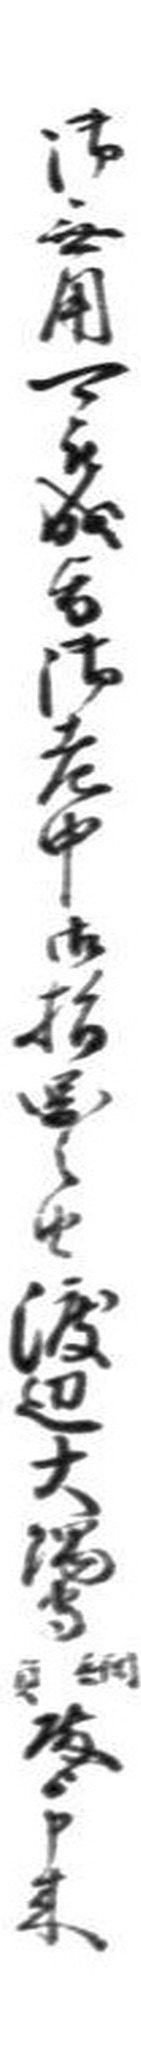御無用可被成旨御老中御指図之由渡辺大隅守綱貞殿ゟ申来
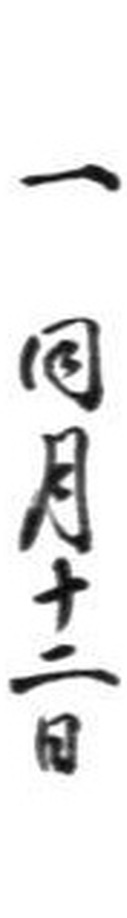一同月十二日
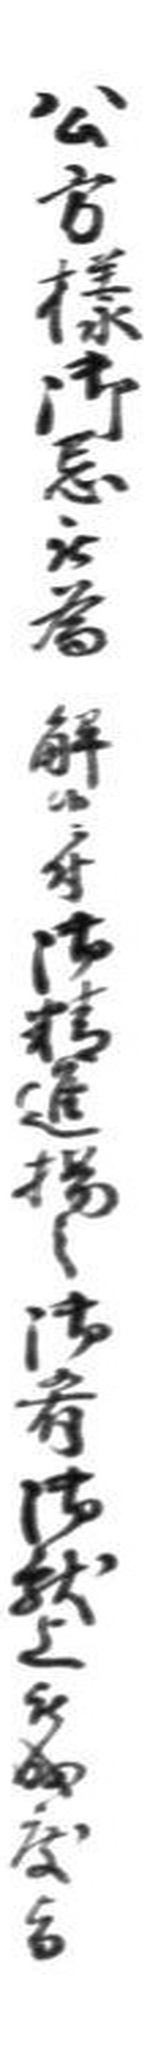公方様御御忌被為解候ニ付御精進揚之御肴御献上被成度旨
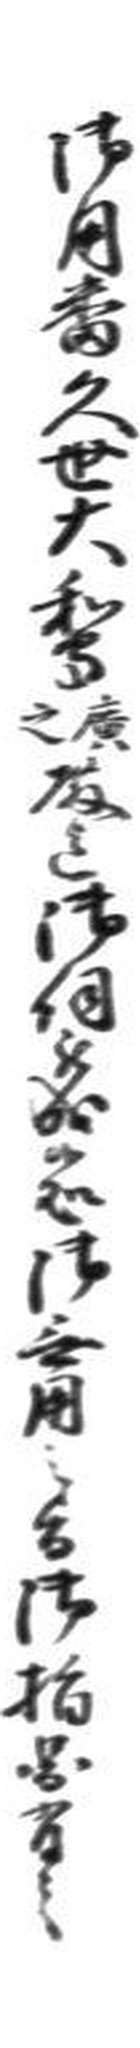御月番久世大和守広之殿迄御伺被成候処御無用之旨御指図有之
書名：家譜 十三 綱昌公 従寛文元年到延宝五年
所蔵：福井県文書館 Fukui Prefectural Archives
